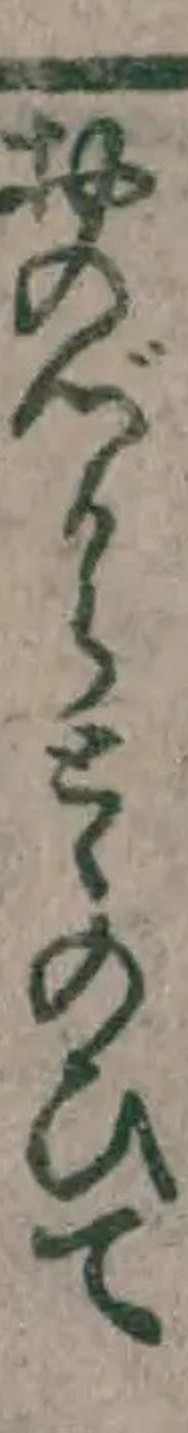おのづからとゝのひて
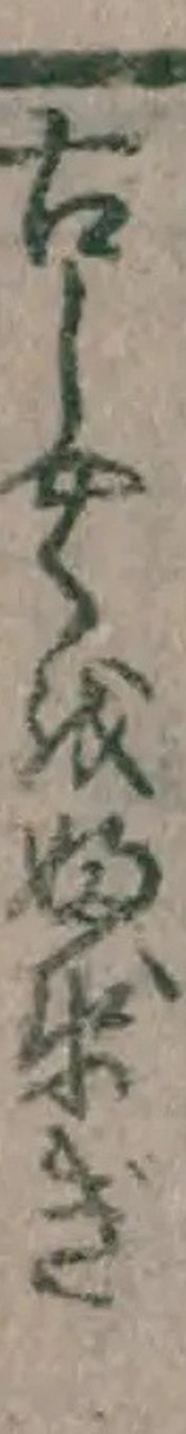古しやくをふせぎ
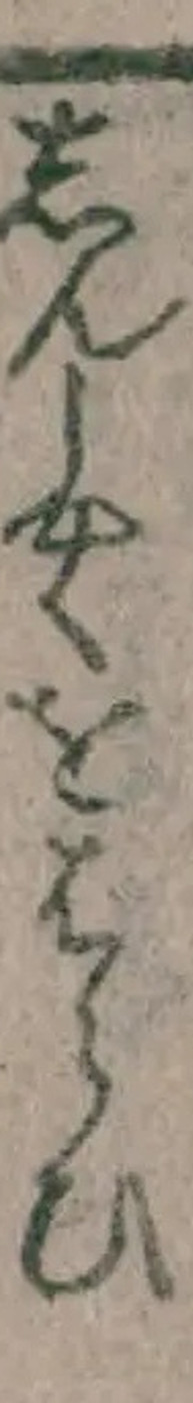しんしやくをはらひ
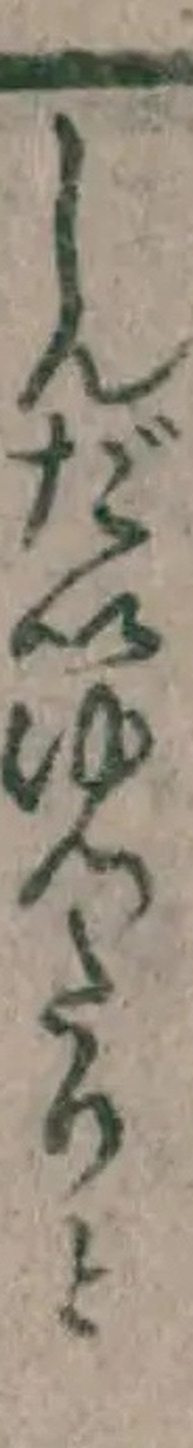しんだいゆつたりと
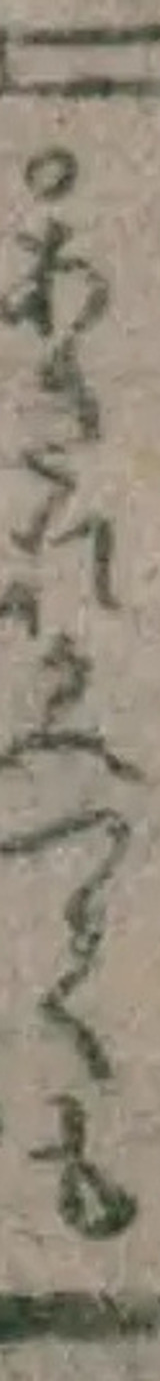○あきれかへつても
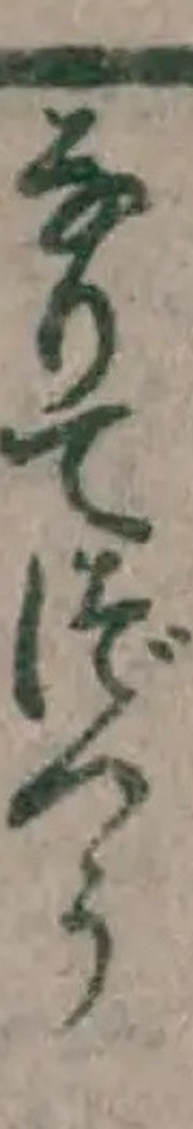なりてづつう
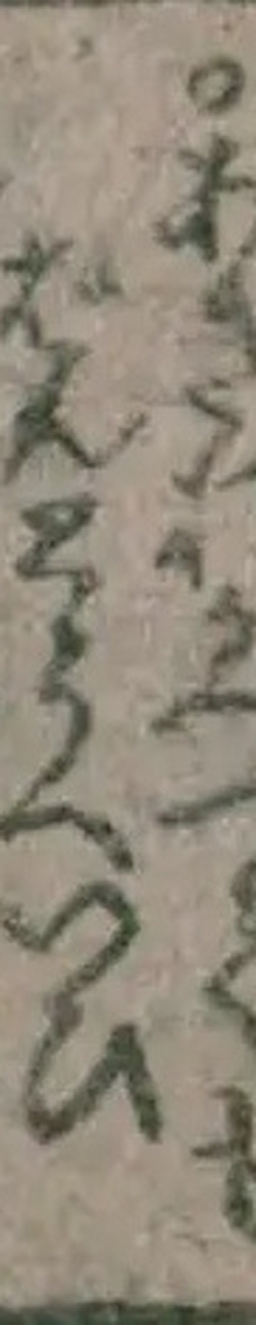ばんとうへいひ
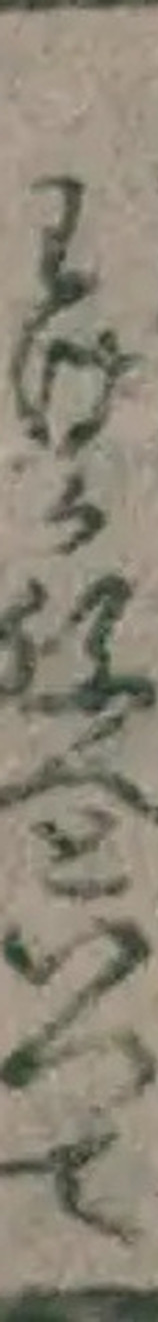わけかねへといつて
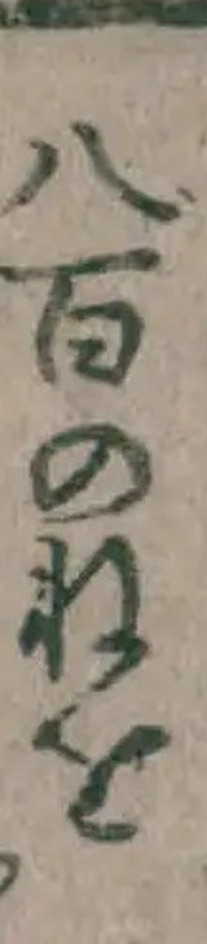八百のねを
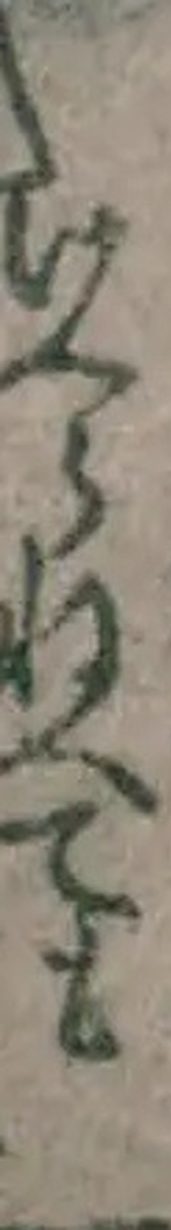けへらねへても
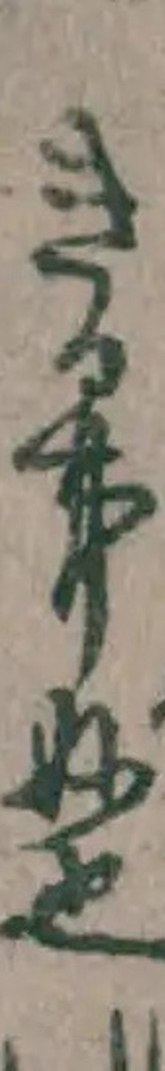きる事妙也
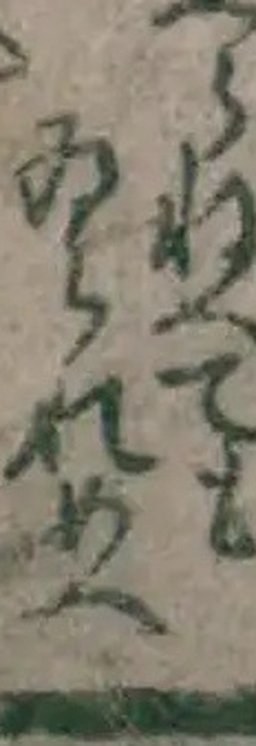ゐられめへ

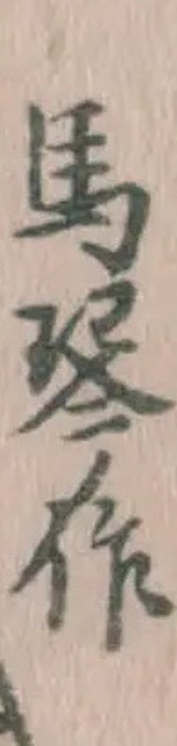馬琴作
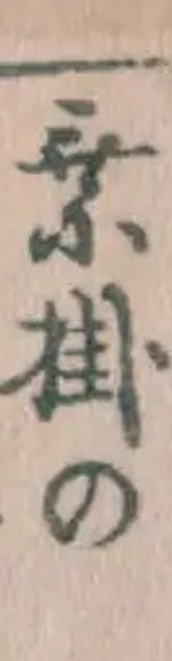乗掛の
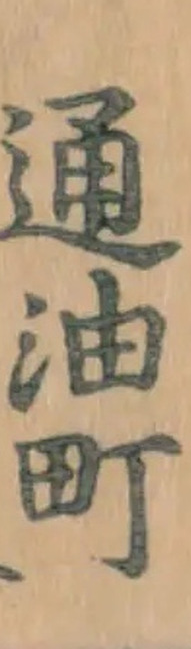通油町
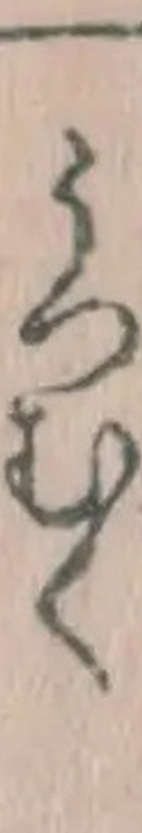うつむく
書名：視薬霞報条 3巻
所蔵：国立国会図書館 National Diet Library, JAPAN
